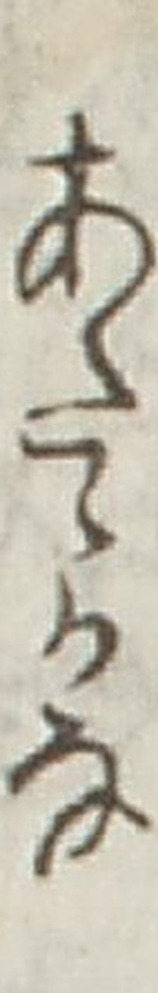あたゝかな
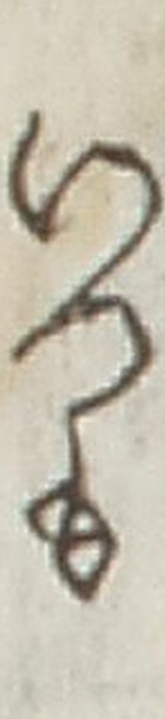いつも
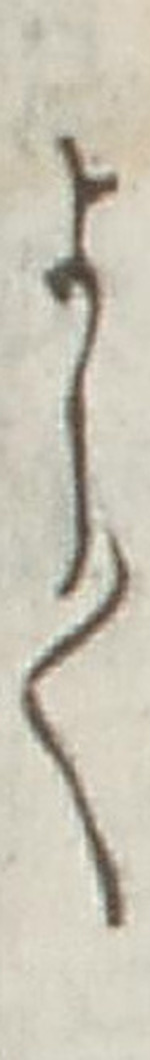よし〳〵

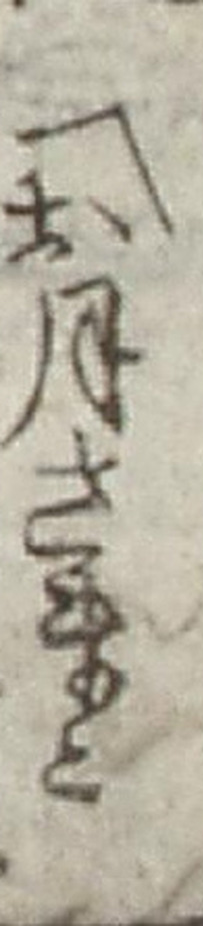〽お月さまと
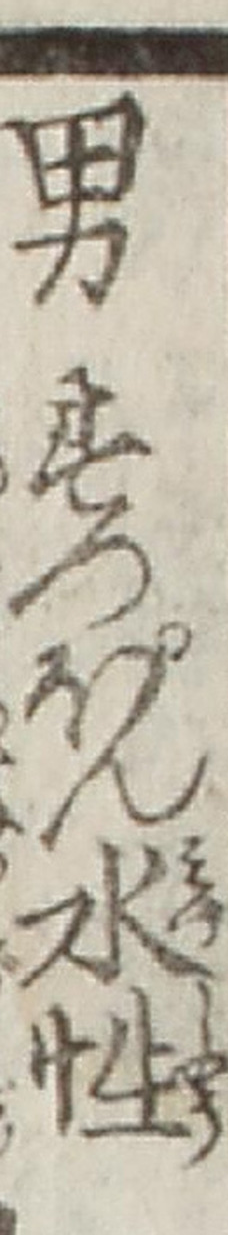男すつぽん水性
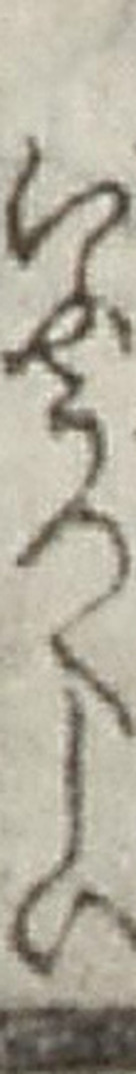いやうつくしい
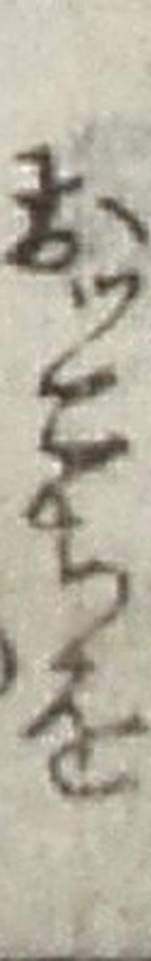おッこちを
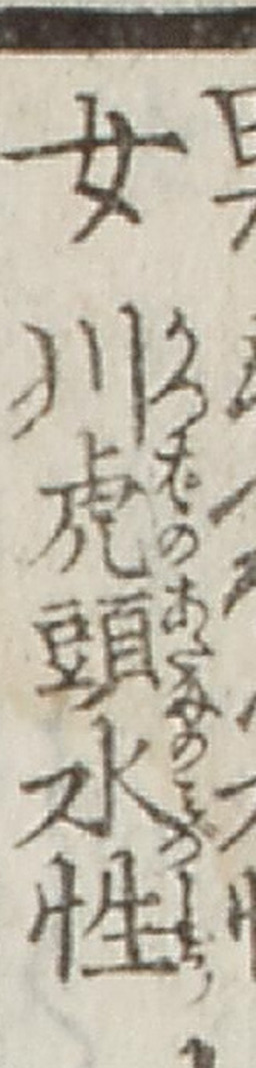女川虎頭水性吉
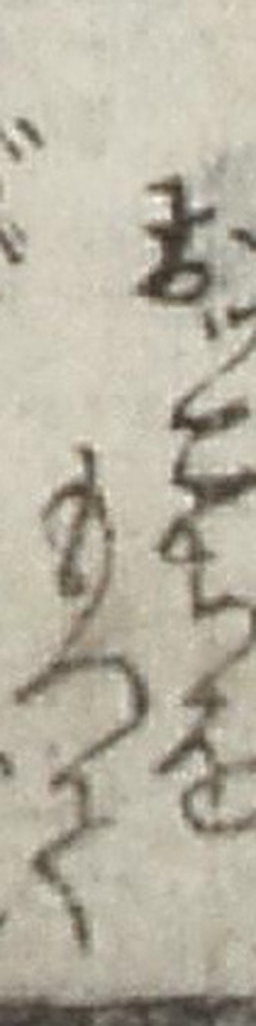もつて
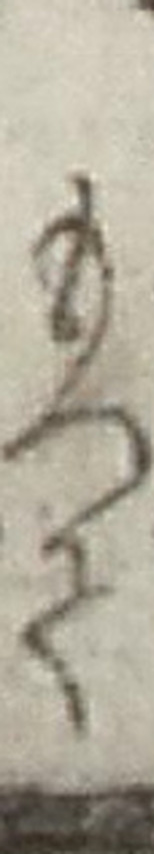もつて
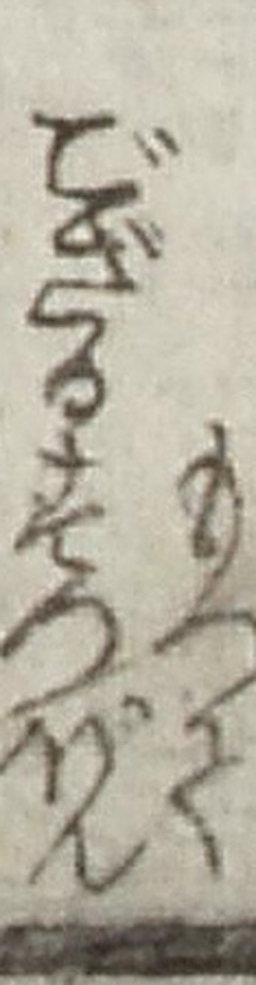ござるすつぽん
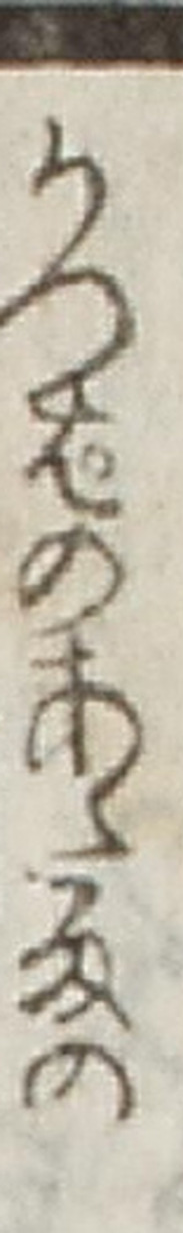かつぱのあたまの
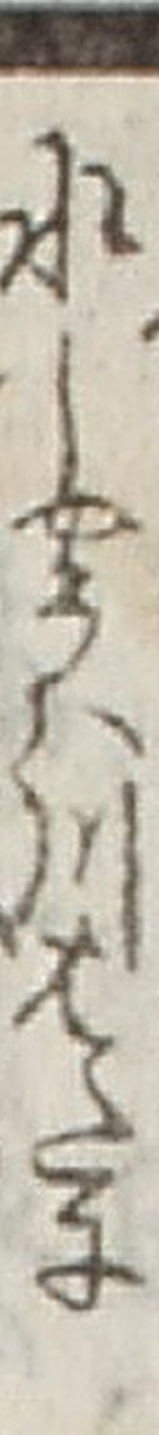水しやうは川はたに
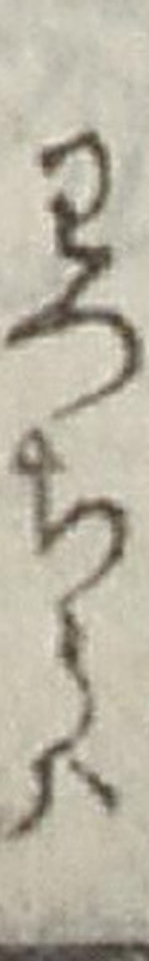わつちらは
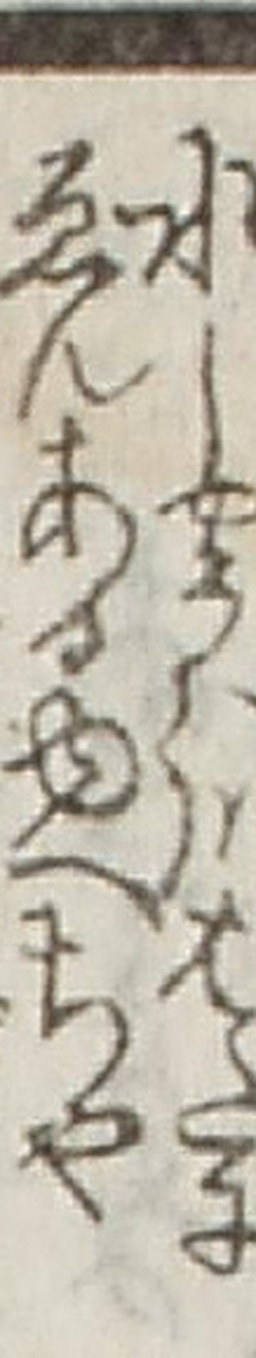えんあるゆへちや
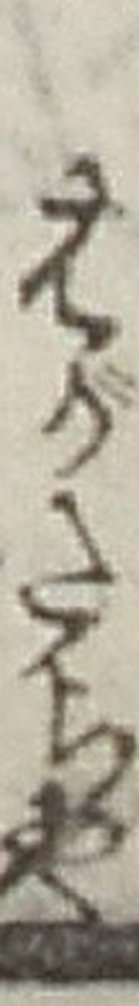はがたちや
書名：三世相出雲當座帳　上下冊
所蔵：東京大学地震研究所図書室 Earthquake Research Institute Library, The University of Tokyo, JAPAN
